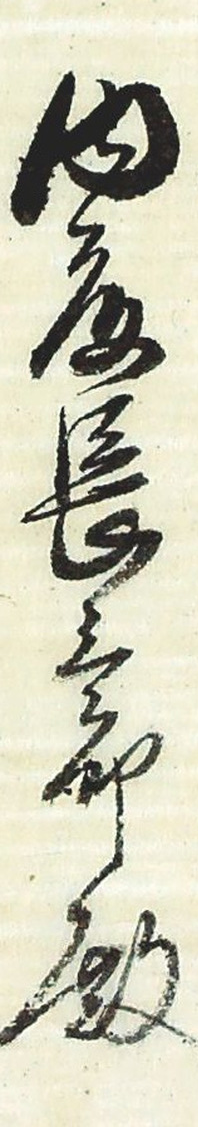内藤長三郎殿
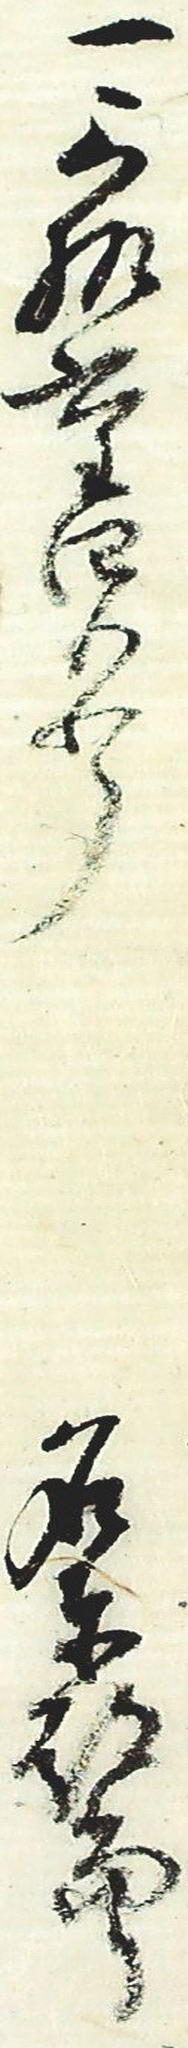一三拾六匁四分五厘名東郡当り
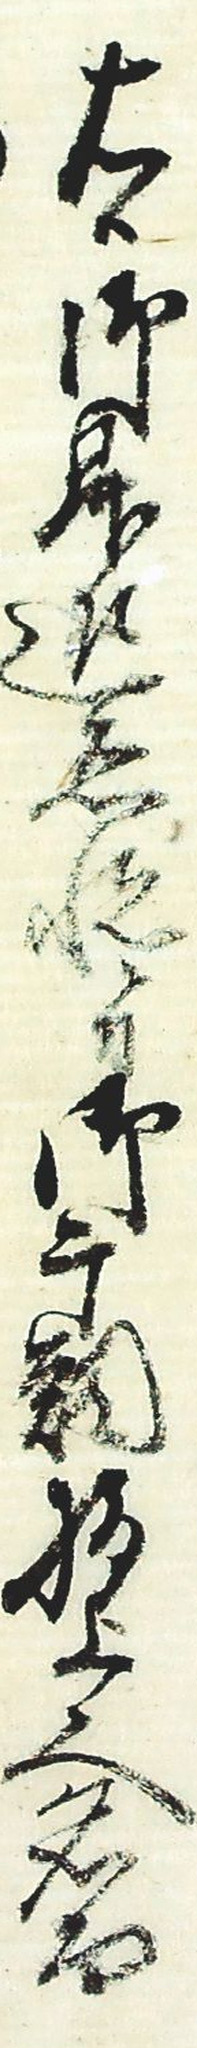右は御昇進恐悦に付御干鯛指上人名面
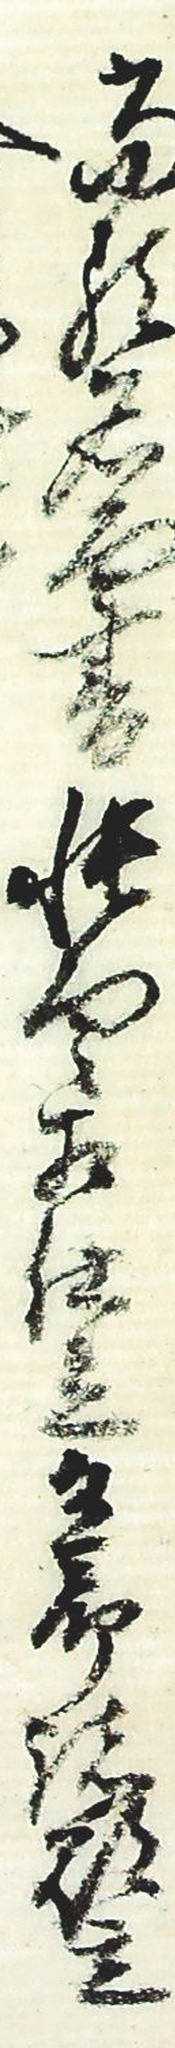当郡名面書帳面に相仕立候節諸郡立
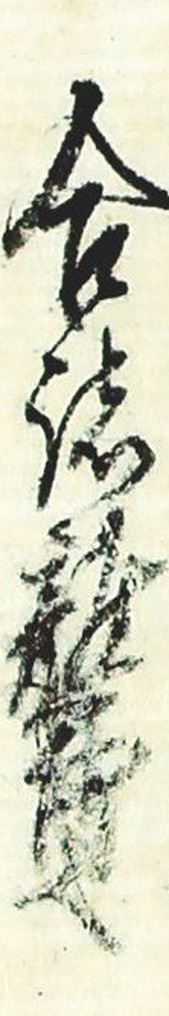合諸雑費
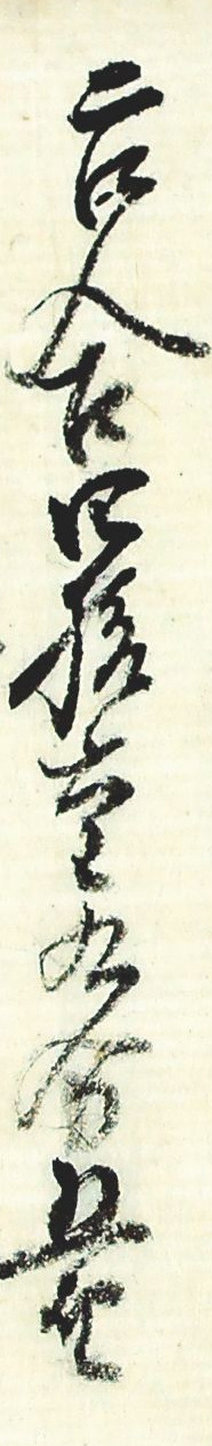二口合四拾六匁九分五厘
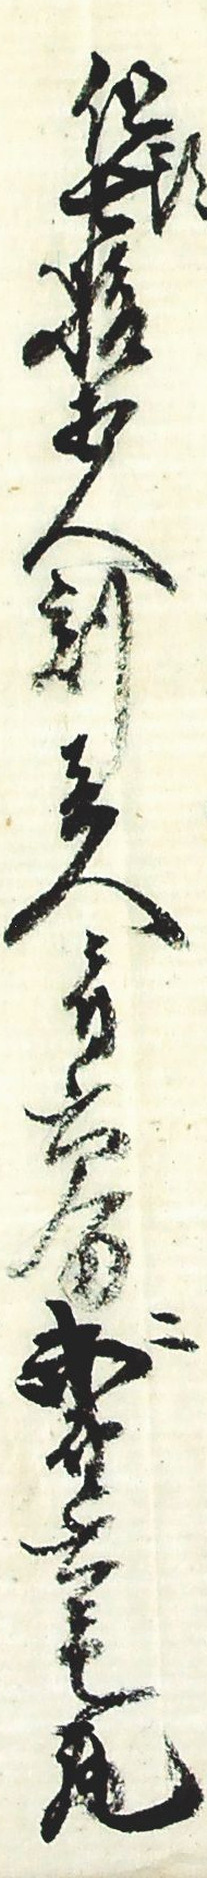但頭七拾五人割壱人に付六分弐厘六毛宛
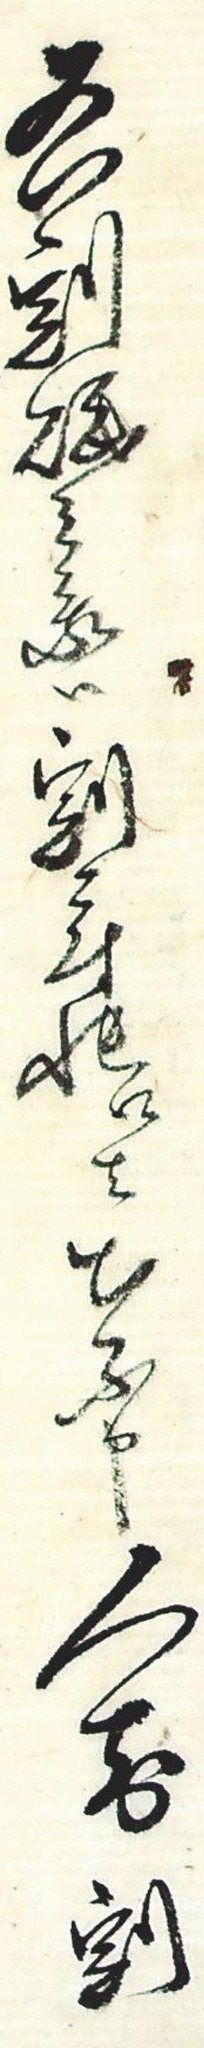右割賦之義は割苻帳えは出不申人前割
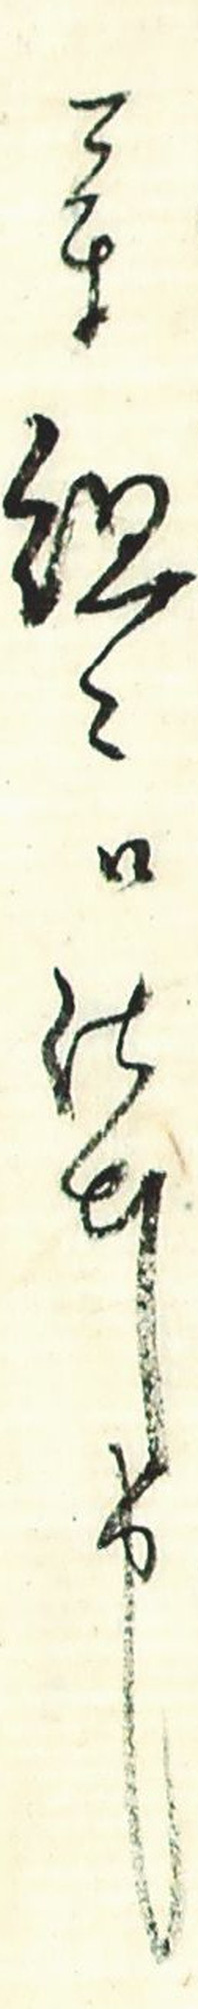に付組々え仕出し申候

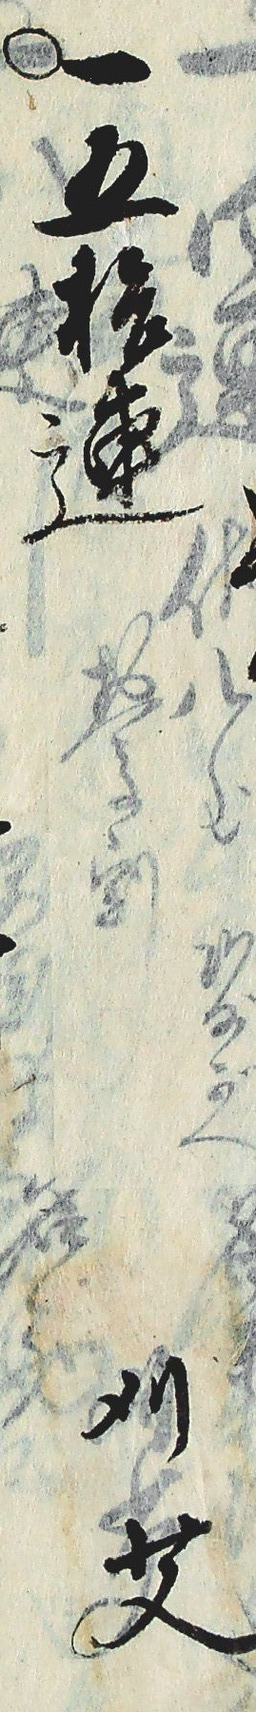一五拾連刈艾
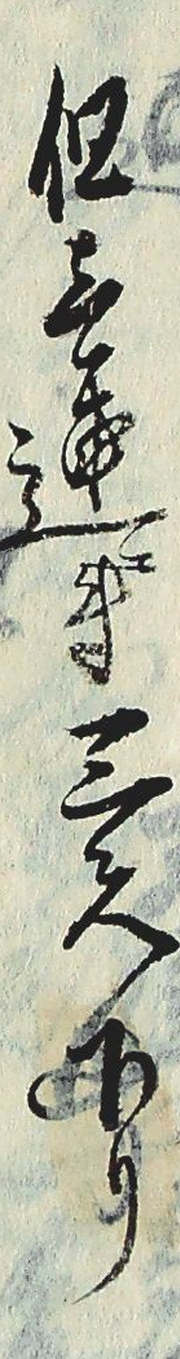但壱連に付三尺下り
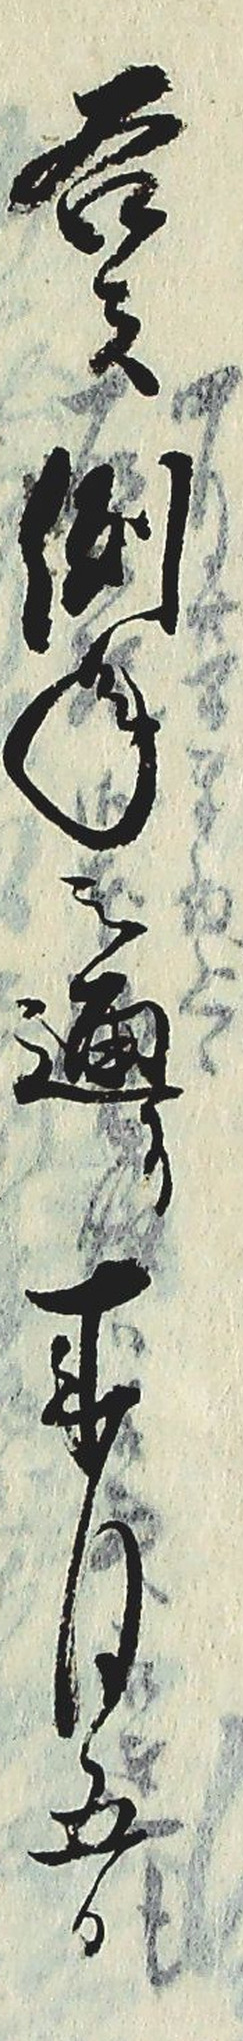右は例年之通り来月五日
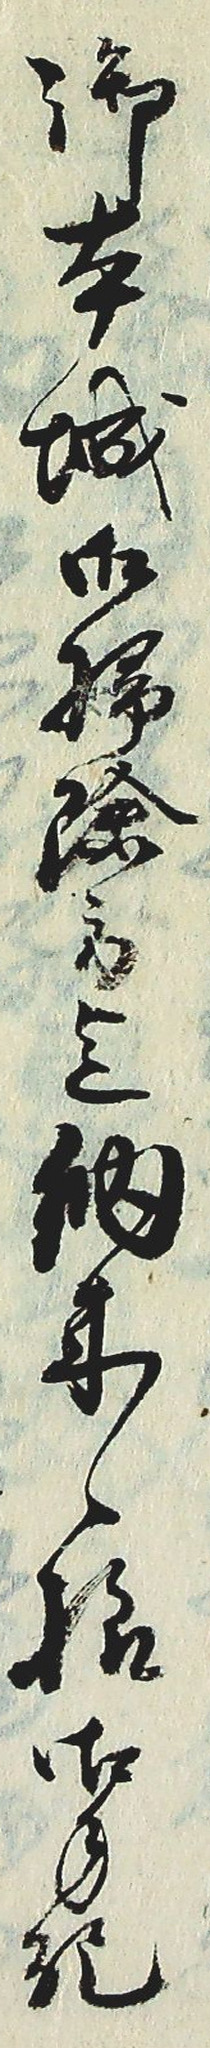御本城御掃除方迄納来候様御手配
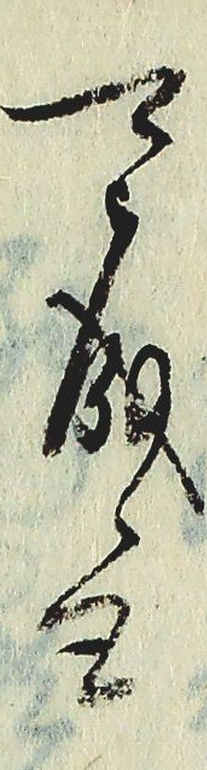可被成候以上
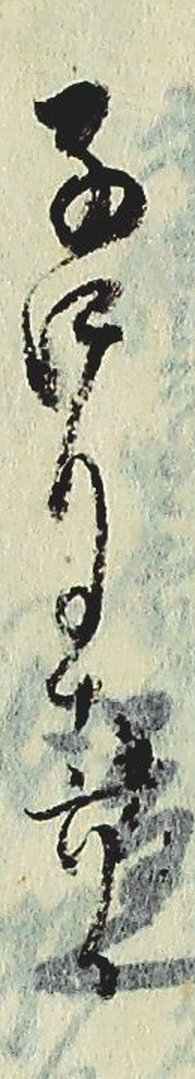子四月廿日
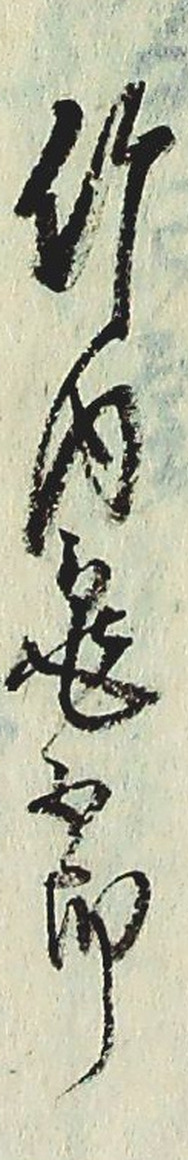竹内亀五郎
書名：名東郡中諸割賦元帳
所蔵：鳴門教育大学 Naruto University of Education
